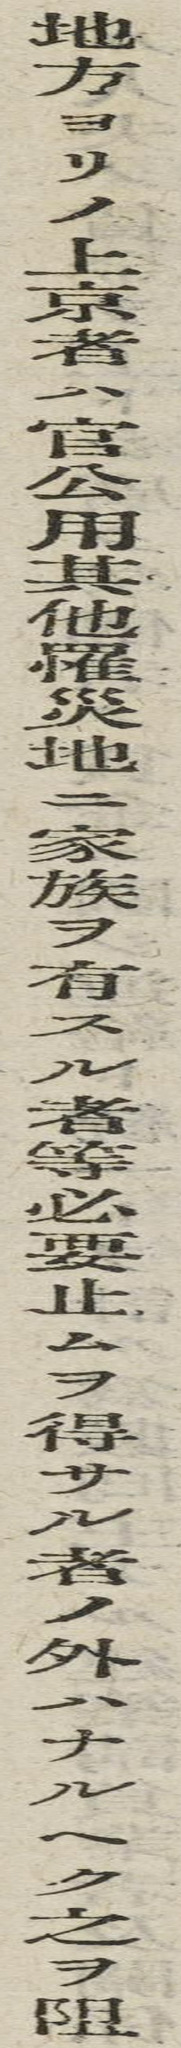地方ヨリノ上京者ハ官公用其他罹災地ニ家族ヲ有スル者等必要止ムヲ得サル者ノ外ハナルヘク之ヲ阻
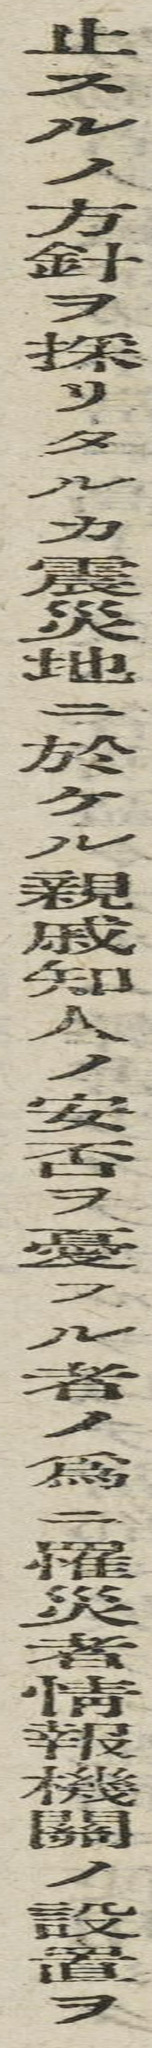止スルノ方針ヲ採リタルカ震災地ニ於ケル親戚知人ノ安否ヲ憂フル者ノ為ニ罹災者情報機関ノ設置ヲ
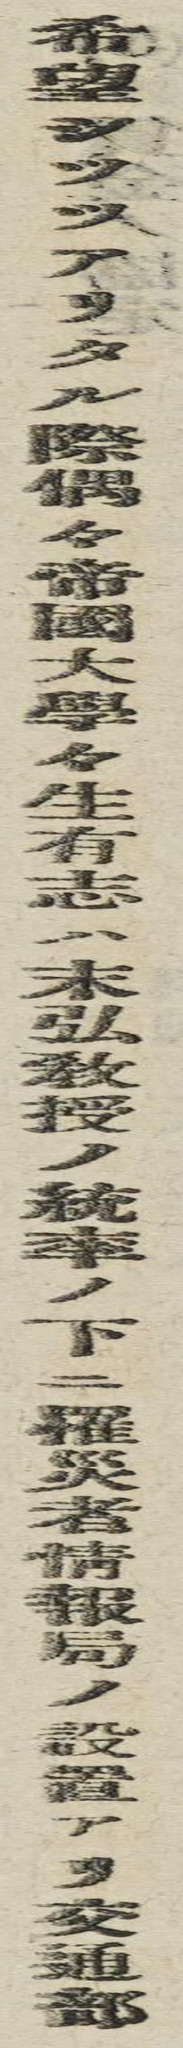希望シツツアリタル際偶々帝国大学々生有志ハ末弘教授ノ統率ノ下ニ罹災者情報局ノ設置アリ交通部
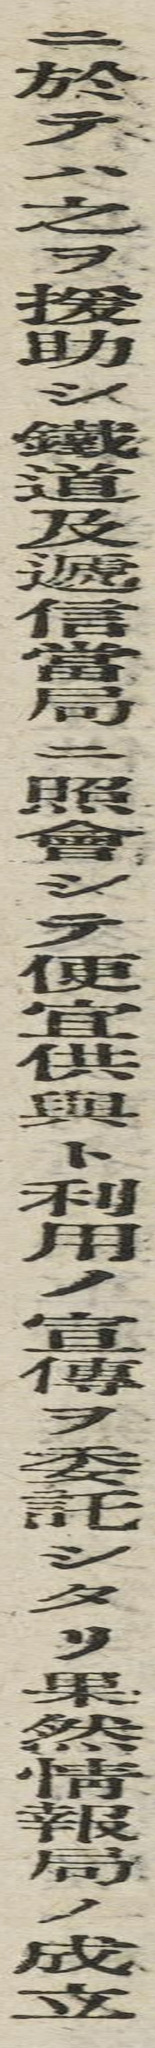ニ於テハ之ヲ援助シ鉄道及逓信当局ニ照会シテ便宜供与ト利用ノ宣伝ヲ委託シタリ果然情報局ノ成立
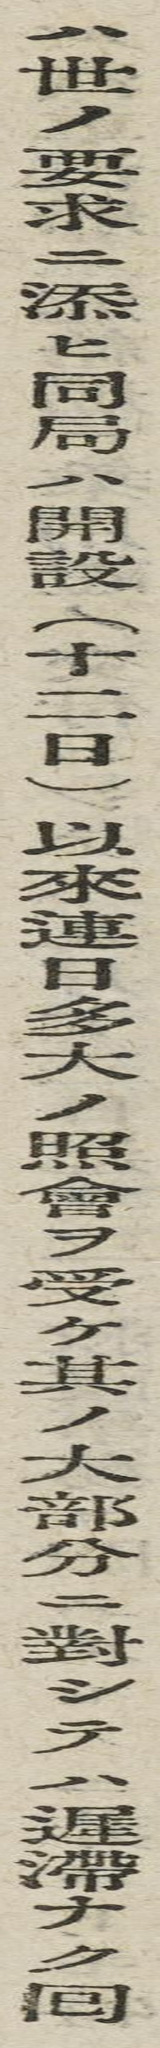ハ世ノ要求ニ添ヒ同局ハ開設以来連日多大ノ照会ヲ受ケ其ノ大部分ニ対シテハ遅滞ナク回
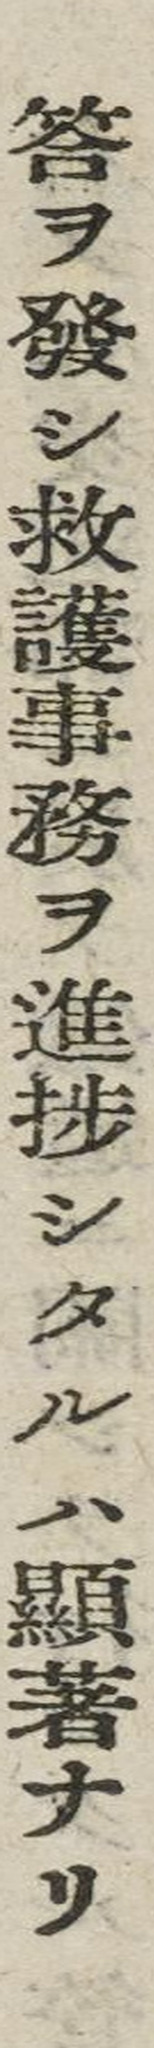答ヲ発シ救護事務ヲ進捗シタルハ顕著ナリ
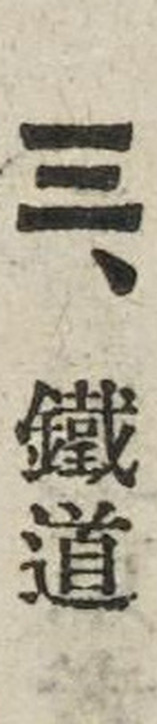三、鉄道
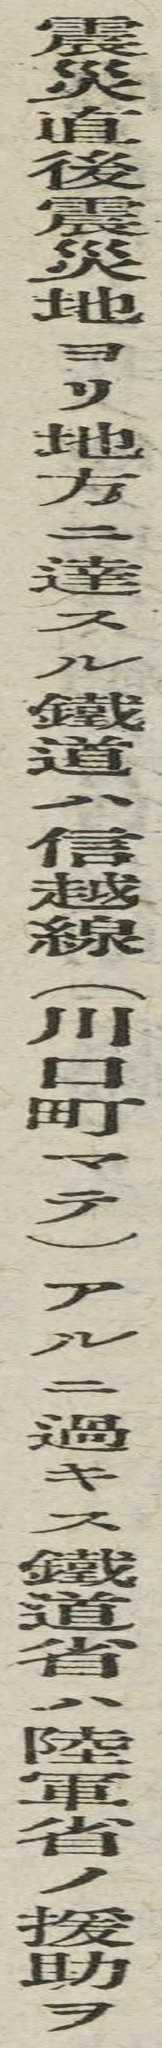震災直後震災地ヨリ地方ニ達スル鉄道ハ信越線アルニ過キス鉄道省ハ陸軍省ノ援助ヲ
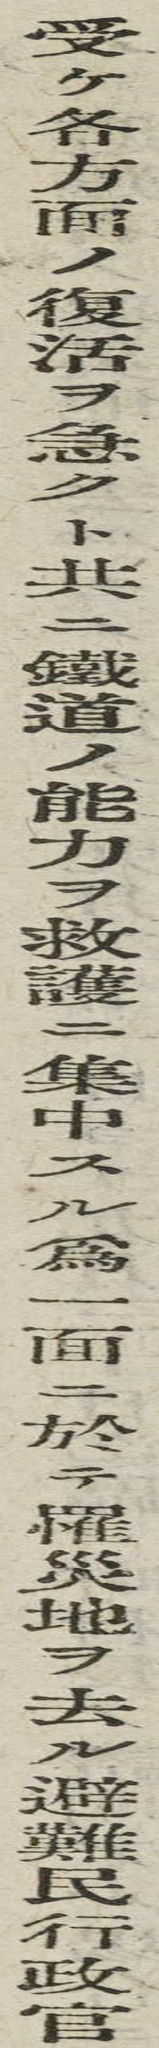受ケ各方面ノ復活ヲ急クト共ニ鉄道ノ能力ヲ救護ニ衆中スル為一面ニ於テ罹災地ヲ去ル避難民行政官
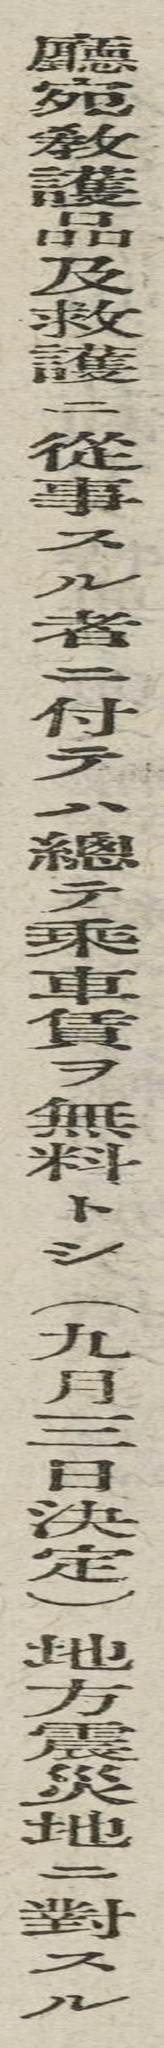庁宛救護品及救護ニ従事スル者ニ付テハ総テ乗車賃ヲ無料トシ地方震災地ニ対スル
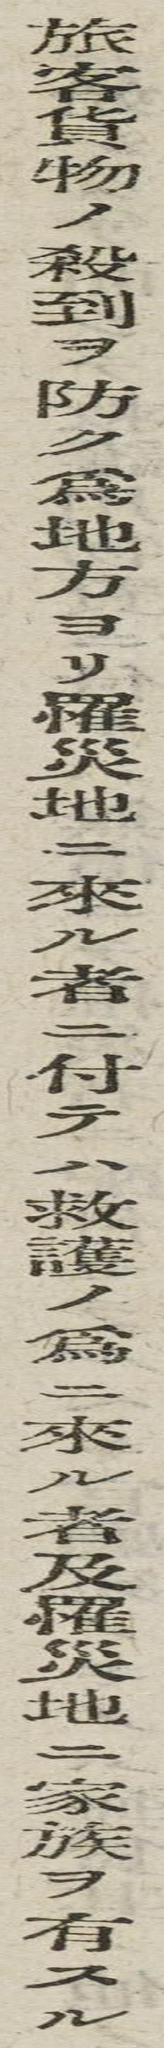旅客貨物ノ殺到ヲ防ク為地方ヨリ罹災地ニ来ル者ニ付テハ救護ノ為ニ来ル者及罹災地ニ家族ヲ有スル
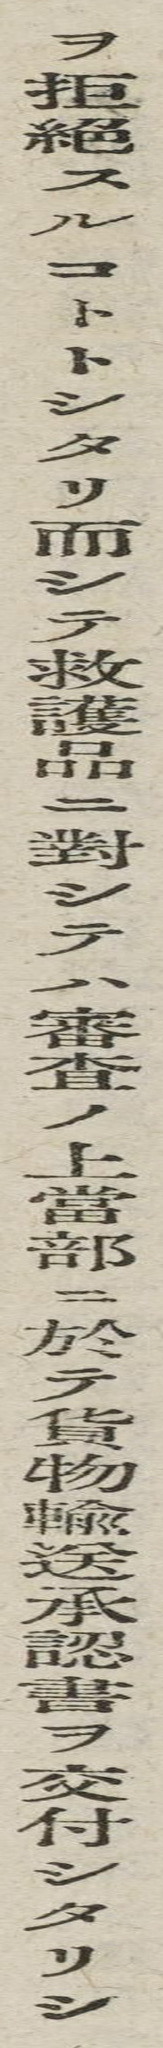ヲ拒絶スルコトトシタリ而シテ救護品ニ対シテハ審査ノ上当部ニ於テ貨物輸送承認書ヲ交付シタリシ
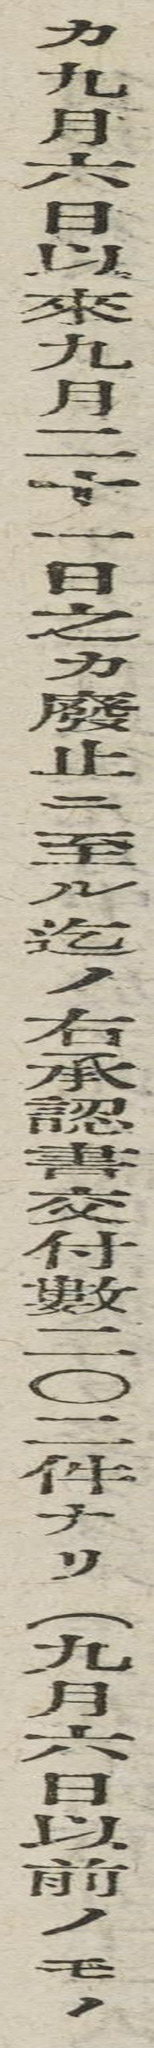カ九月六日以来九月二十一日之カ廃止ニ至ル迄ノ右承認書交付数二〇二件ナリ（九月六日以前ノモノ
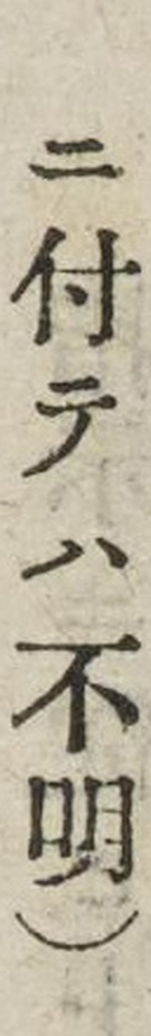ニ付テハ不明）
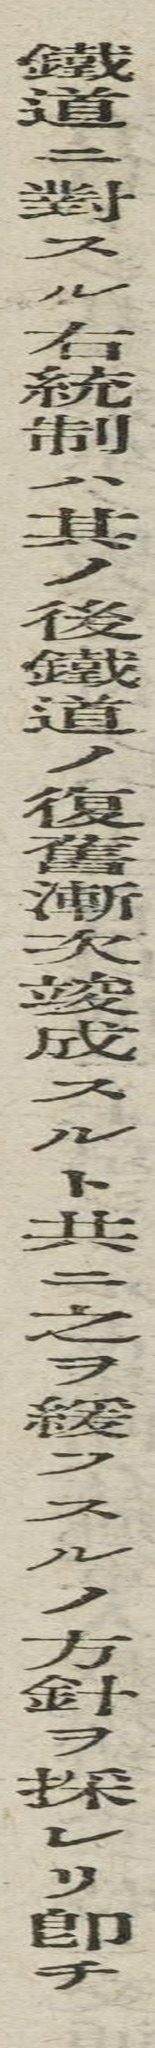鉄道ニ対スル右統制ハ其ノ後鉄道ノ復旧漸次竣成スルト共ニ之ヲ緩フスルノ方針ヲ採レリ即チ
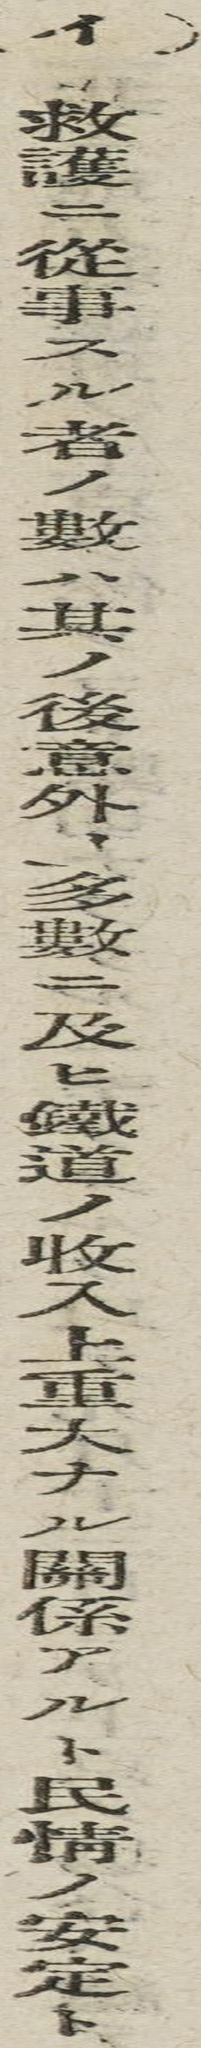救護ニ従事スル者ノ数ハ其ノ後意外ニ多数ニ及ヒ鉄道ノ収入上重大ナル関係アルト民情ノ安定ト
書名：震災被害状況並救護施設概要
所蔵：東京大学地震研究所図書室 Earthquake Research Institute Library, The University of Tokyo, JAPAN
